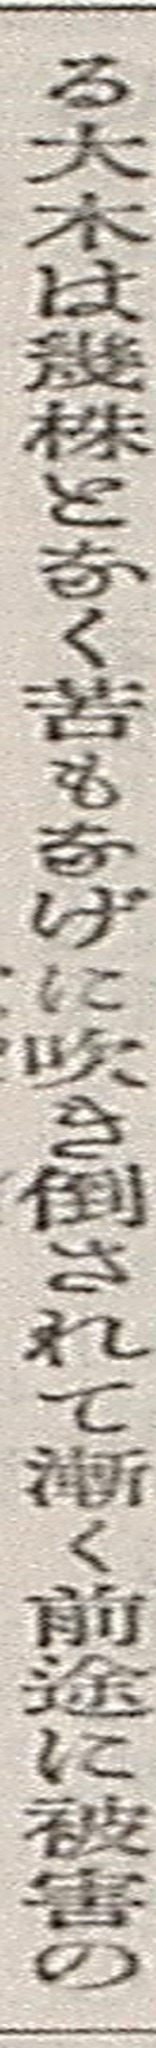る大木は幾株となく苦もなげに吹き倒されて漸く前途に被害の
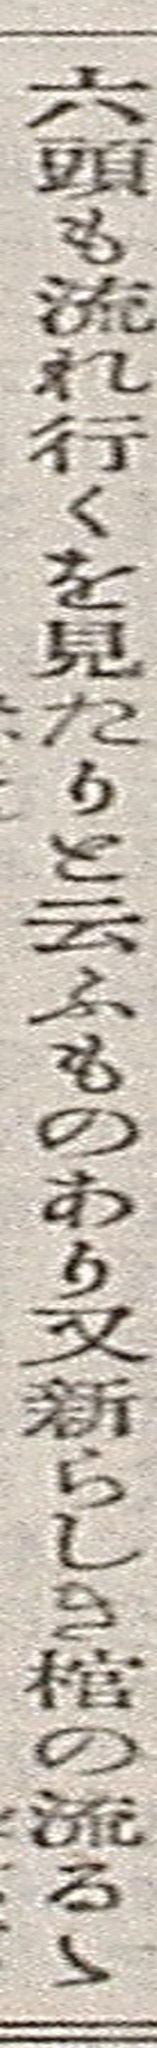六頭も流れ行くを見たりと云ふものあり又新らしき棺の流るゝ
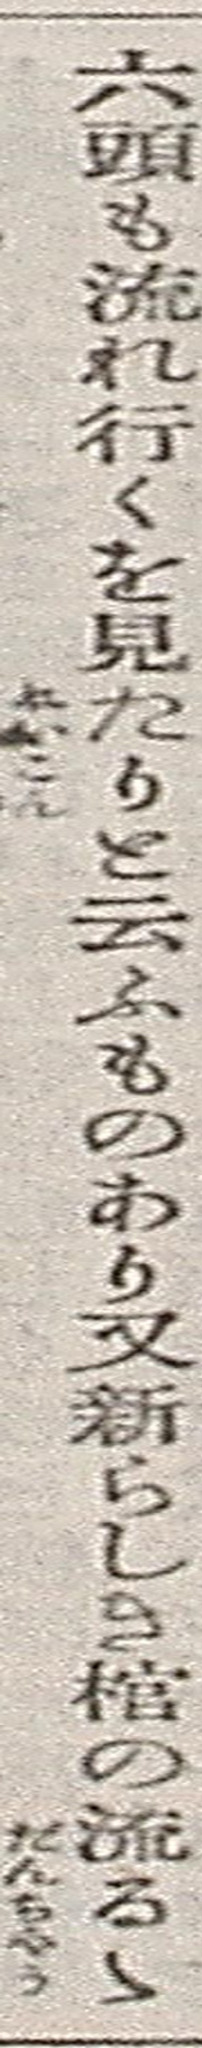六頭も流れ行くを見たりと云ふものあり又新らしき棺の流るゝ
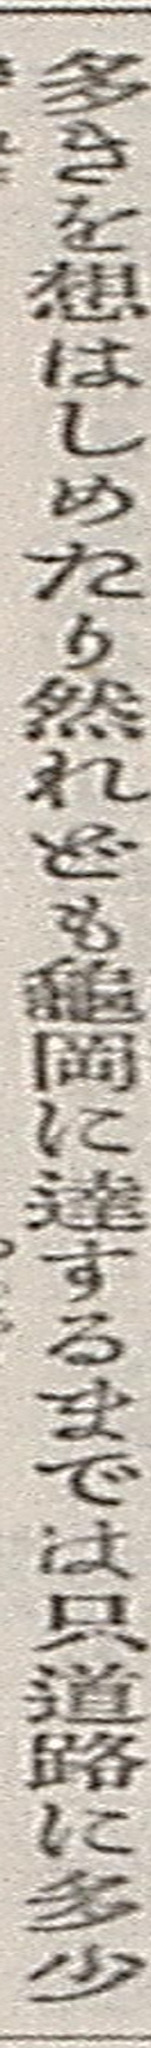多きを想はしめたり然れども亀岡に達するまでは只道路に多少
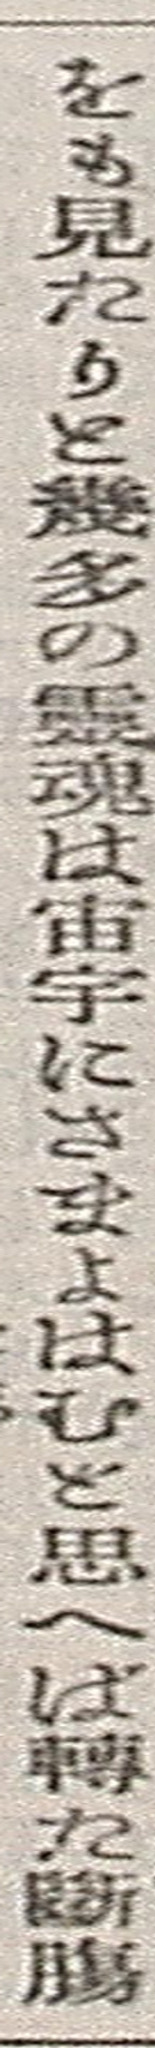をも見たりと幾多の霊魂は宇宙にさまよはむと思へば転た断腸
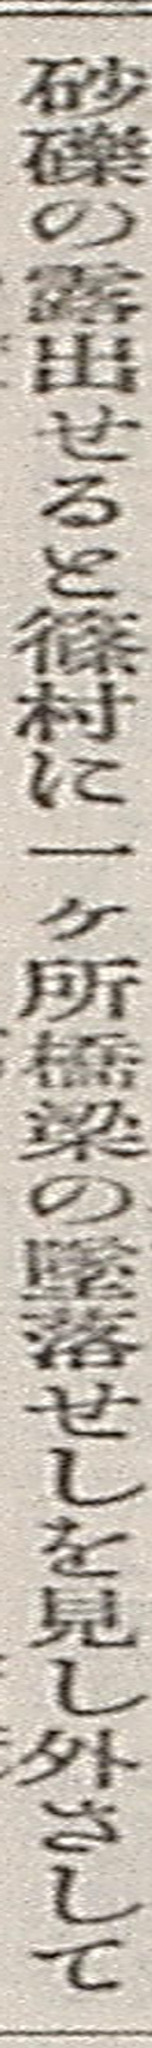砂礫の露出せると篠村に一ヶ所橋梁の墜落せしを見し外さして
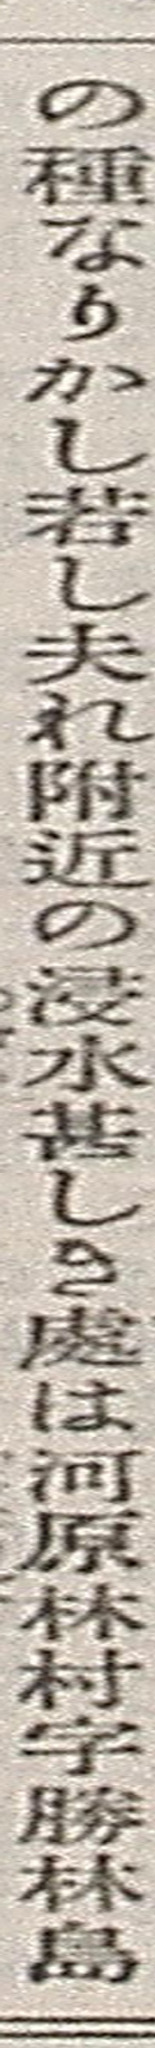の種なりかし若し夫れ附近の浸水甚しき処は河原林村字勝林島
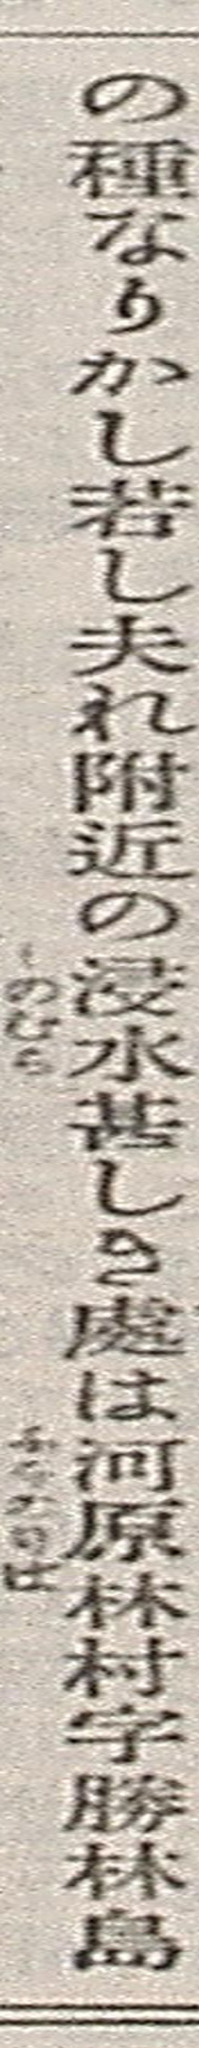の種なりかし若し夫れ附近の浸水甚しき処は河原林村字勝林島
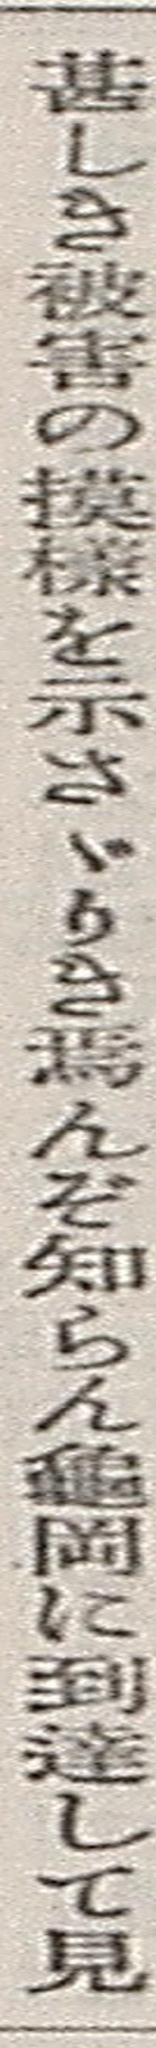甚しき被害の模様を示さゞりき焉んぞ知らん亀岡に到達して見
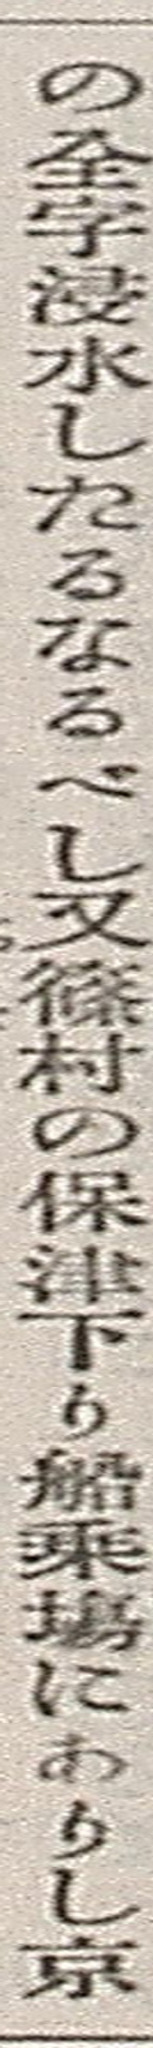の全字浸水したるなるべし又篠村の保津下り船乗場にありし京
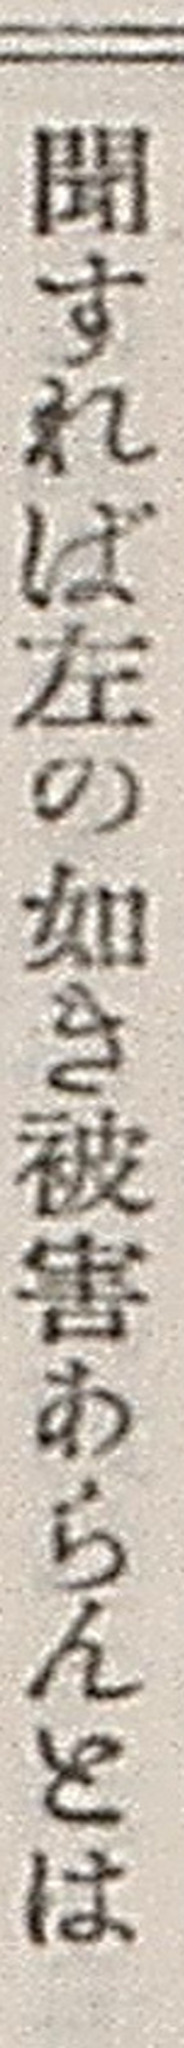聞すれば左の如き被害あらんとは
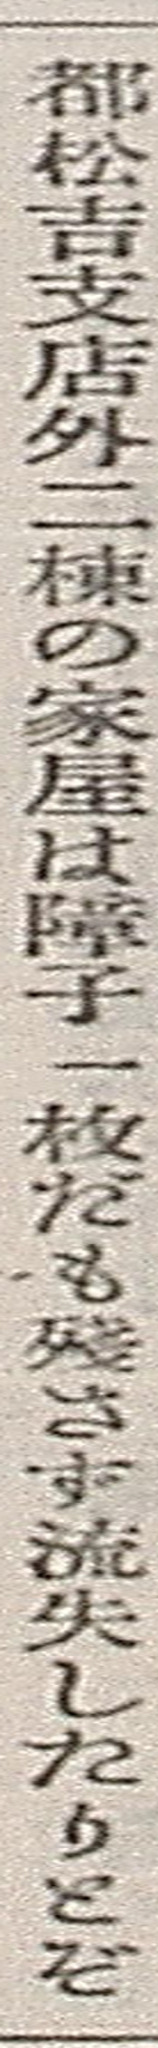都松吉支店外二棟の家屋は障子一枚だも残さず流失したりとぞ
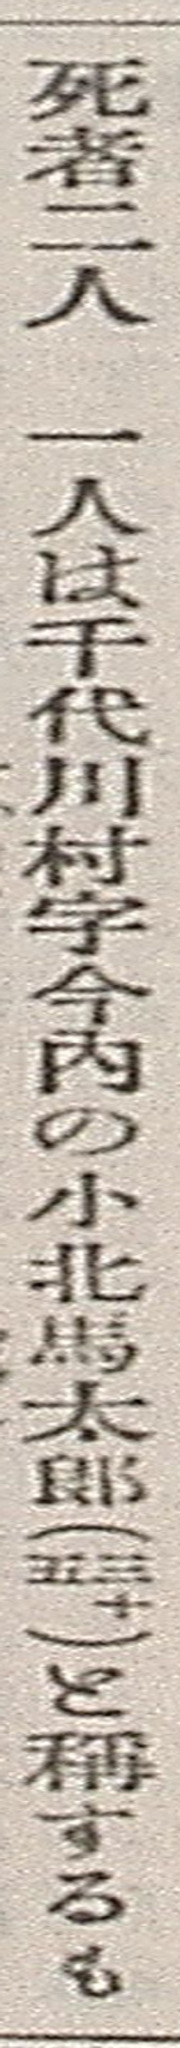死者二人一人は千代川村字今内の小北馬太郎と称するも
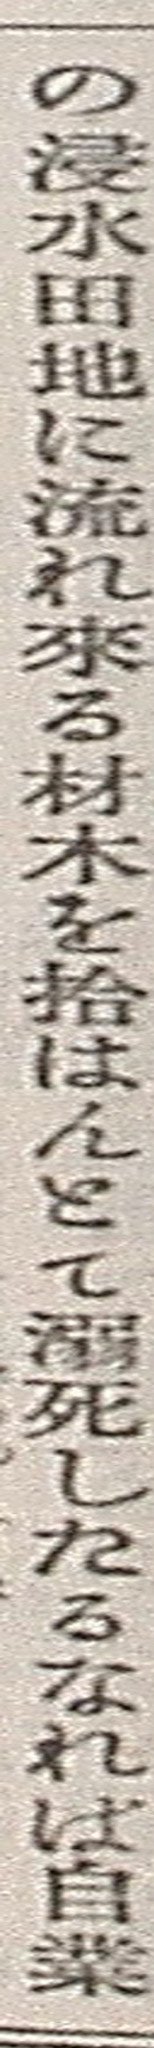の浸水田地に流れ来る材木を拾はんとて溺死したるなれば自業
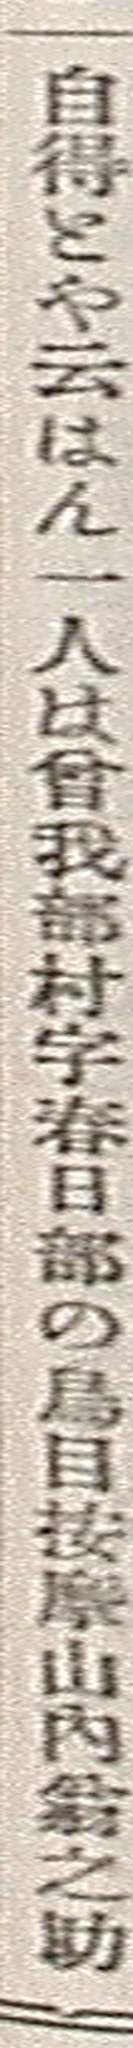自得とや云はん一人は曽我部村字春日部の鳥目按摩山内翁之助
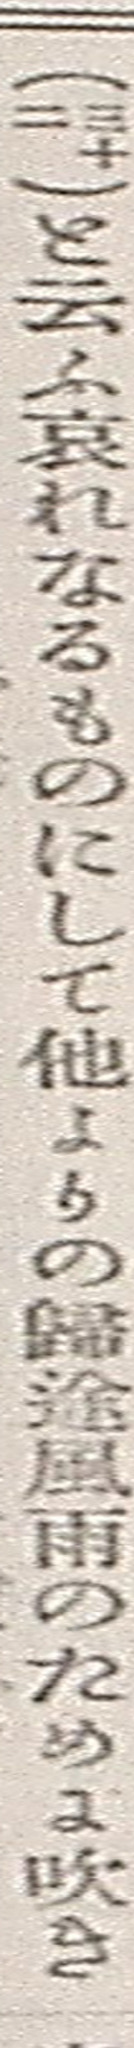と云ふ哀れなるものにして他よりの帰路風雨のために吹き
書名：風俗畫報臨時増刊第百二十六號　洪水被害録（中）
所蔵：東京大学地震研究所図書室 Earthquake Research Institute Library, The University of Tokyo, JAPAN
